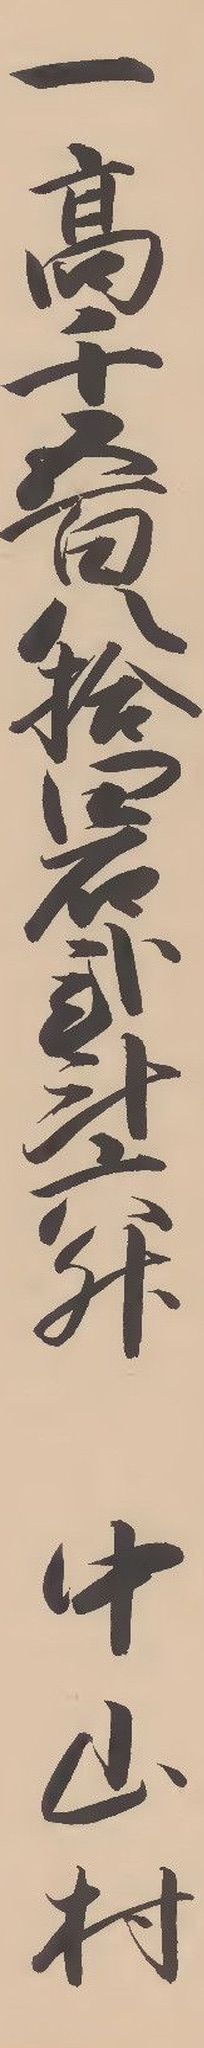一高千五百八拾四石弐斗六升中山村
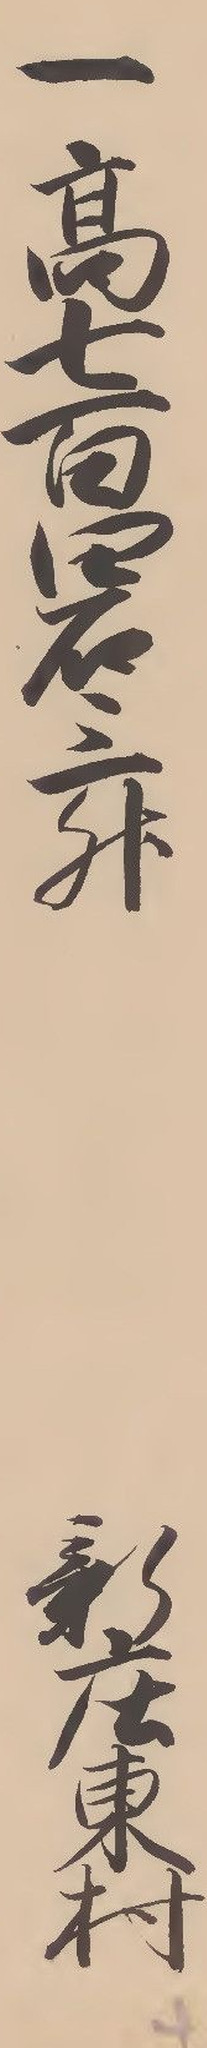一高七百四石三升新庄東村
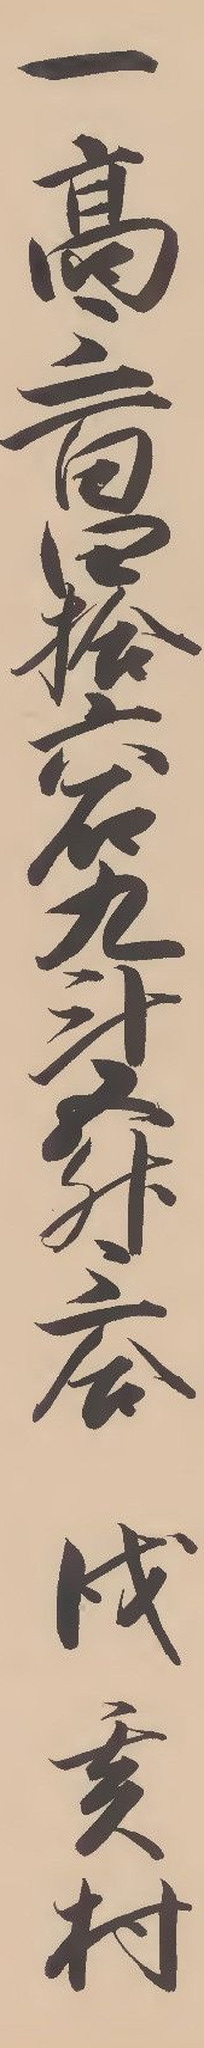一高三百四拾六石九斗五升三合戌亥村
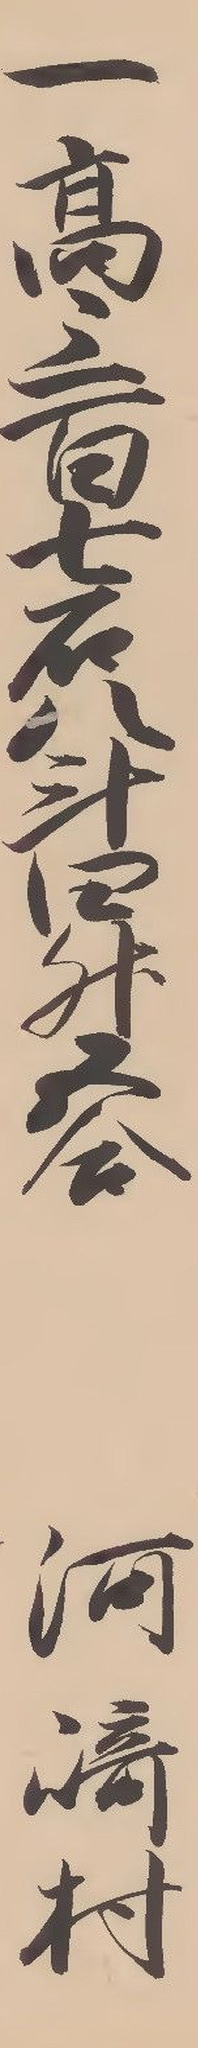一高三百七石八斗四升五合河崎村

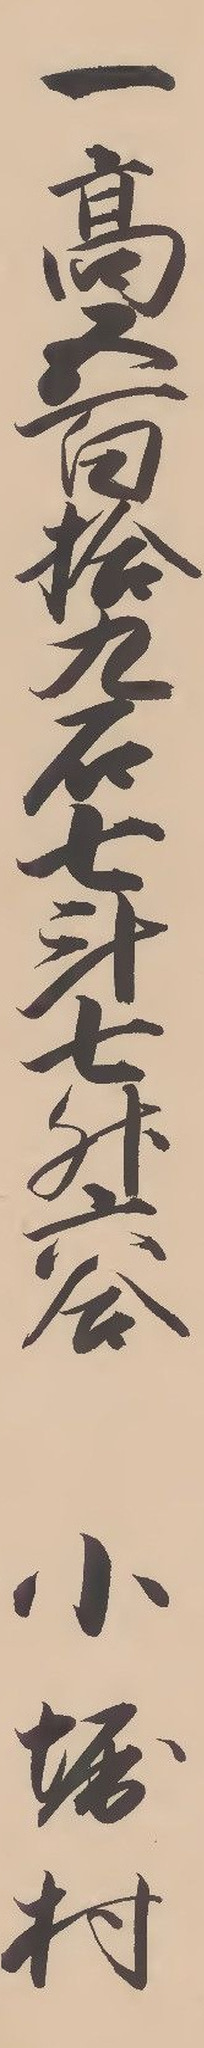一高五百拾九石七斗七升六合小堀村
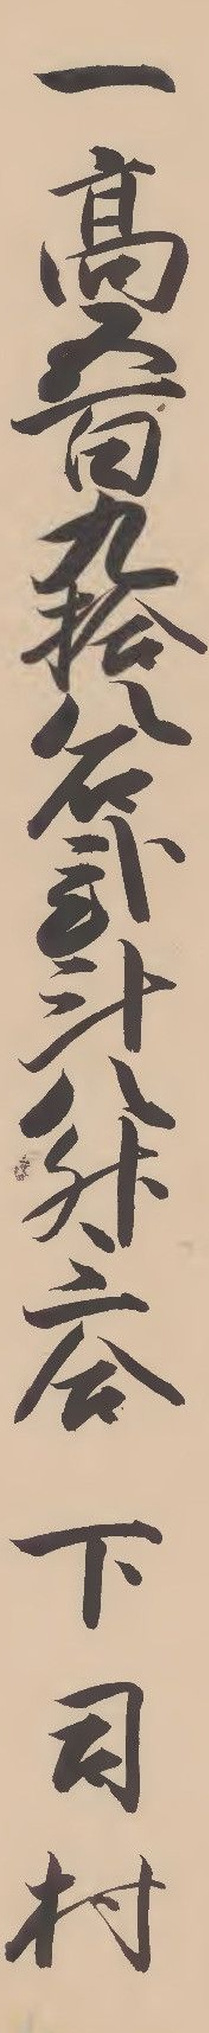一高五百九拾八石弐斗八升三合下司村
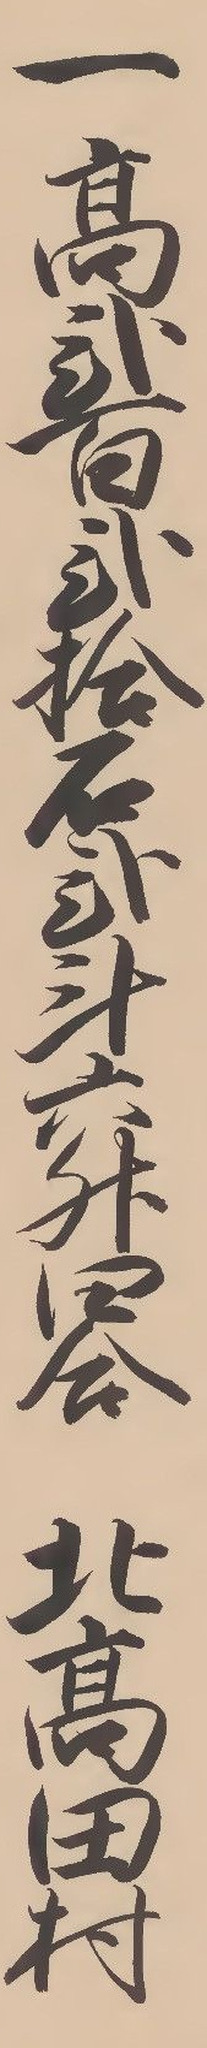一高弐百弐拾石弐斗六升四合北高田村
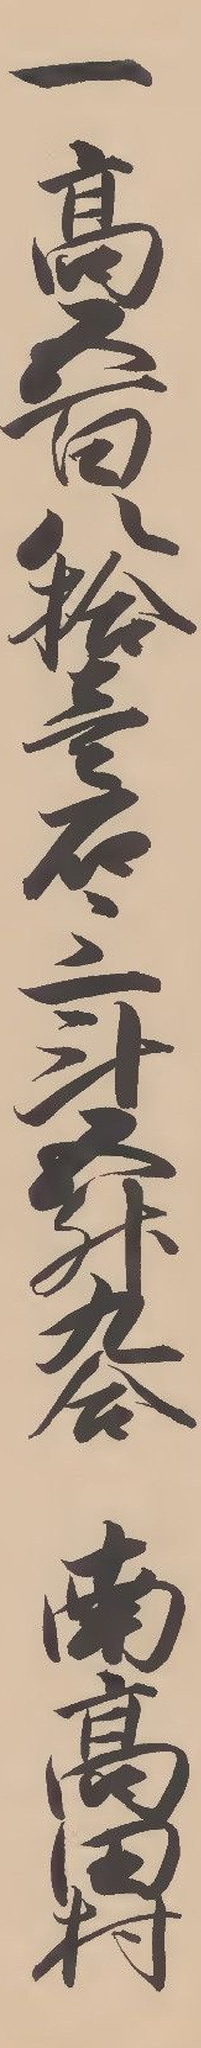一高五百八拾壱石三斗五升九合南高田村
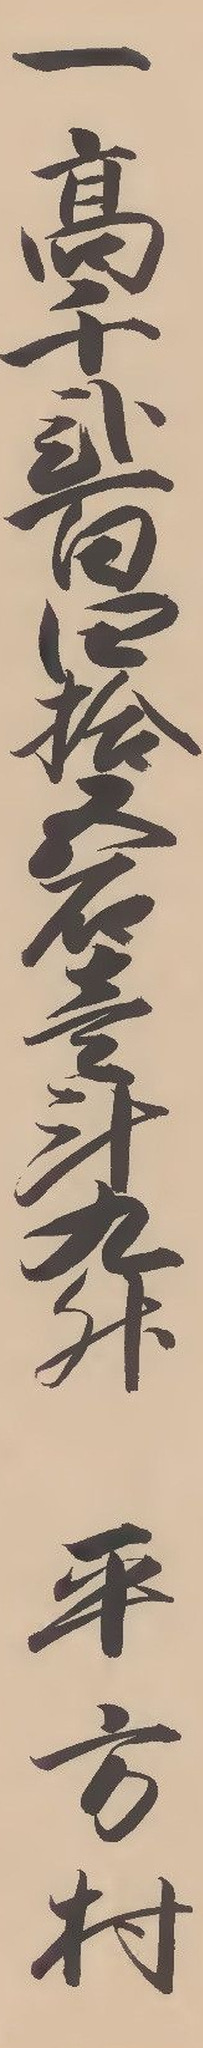一高千弐百四拾五石壱斗九升平方村
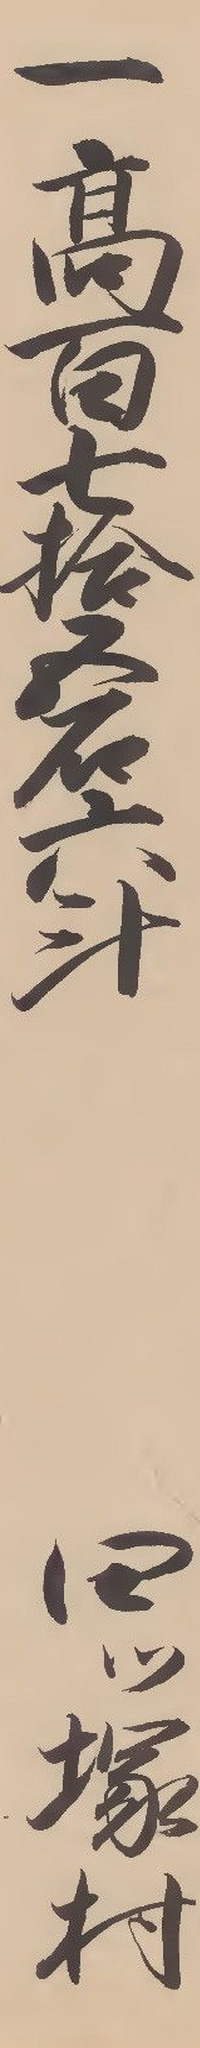一高百七拾五石六斗四ツ塚村
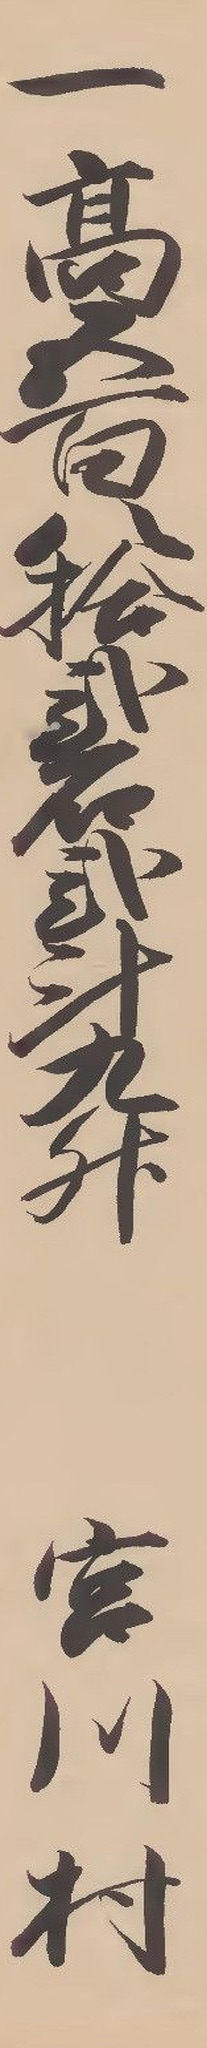一高五百八拾弐石弐斗九升宮川村

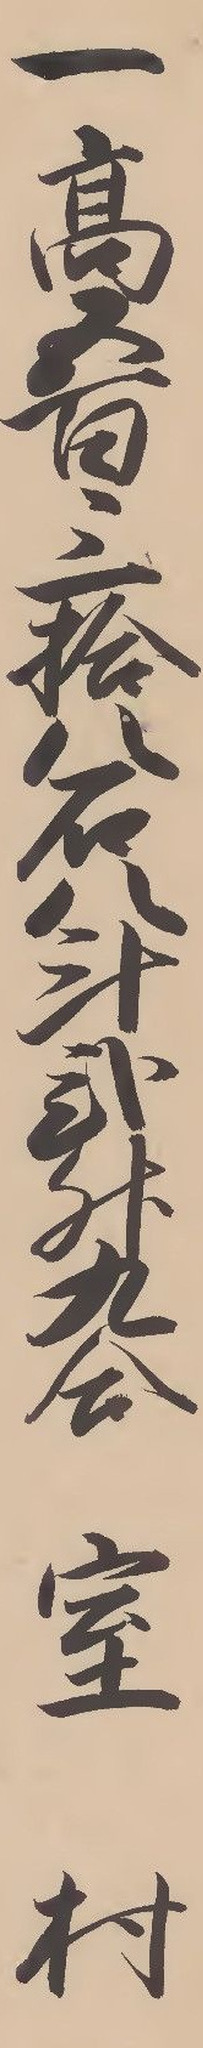一高五百三拾八石八斗弐升九合室村
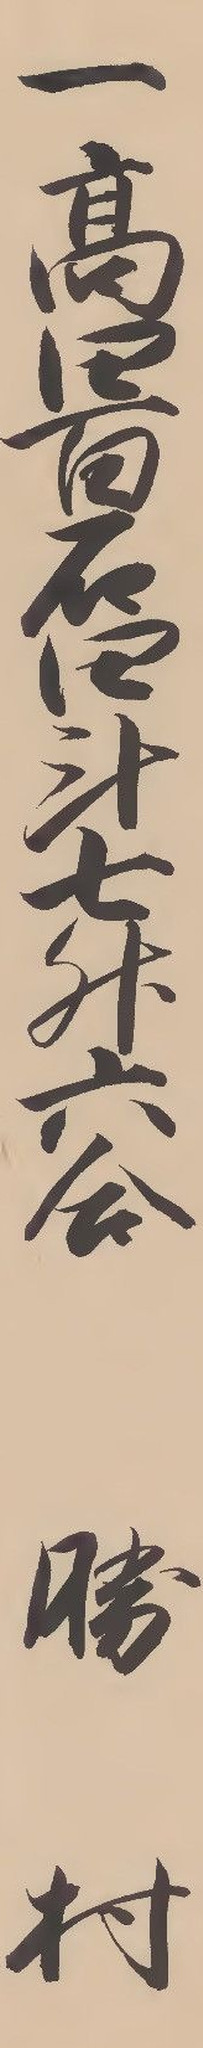一高四百石四斗七升六合勝村
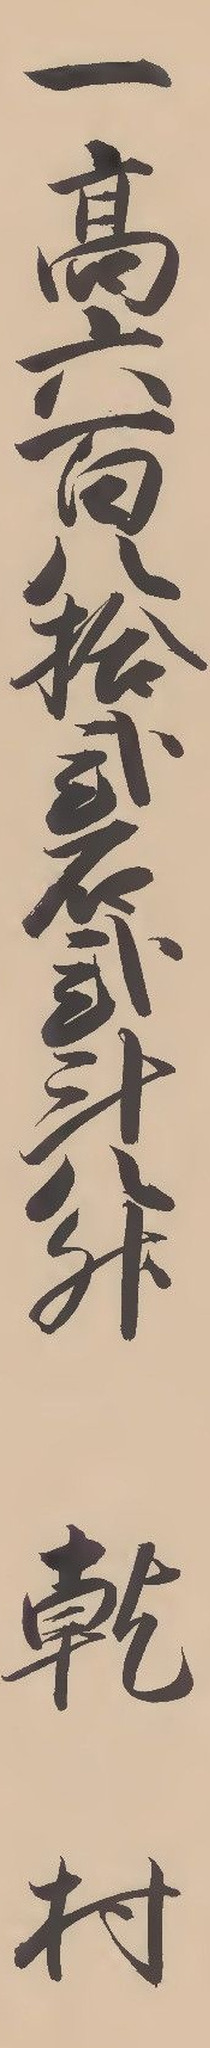一高六百八拾弐石弐斗八升乾村
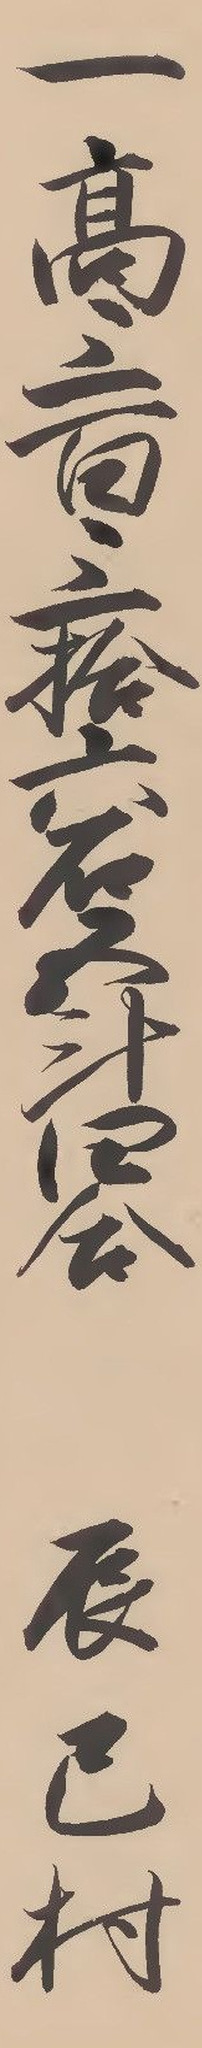一高三百三拾六石五斗四合辰己村
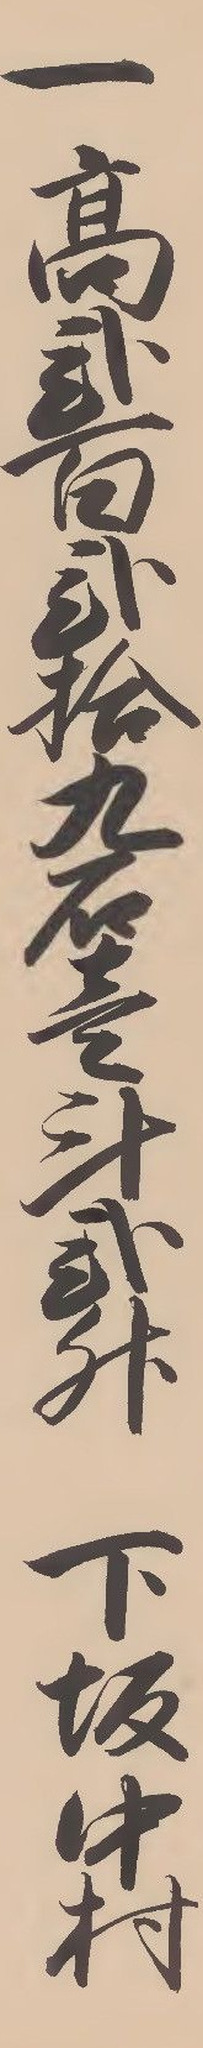一高弐百弐拾九石壱斗弐升下坂中村
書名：近江国郷帳
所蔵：国立公文書館 National Archives of Japan
